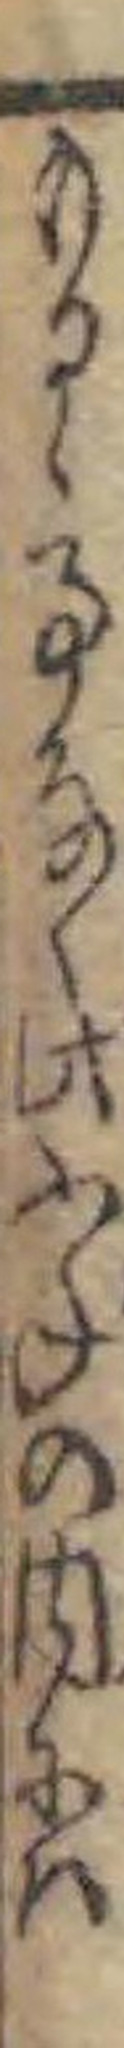もるゝ事なく此ふねの内に
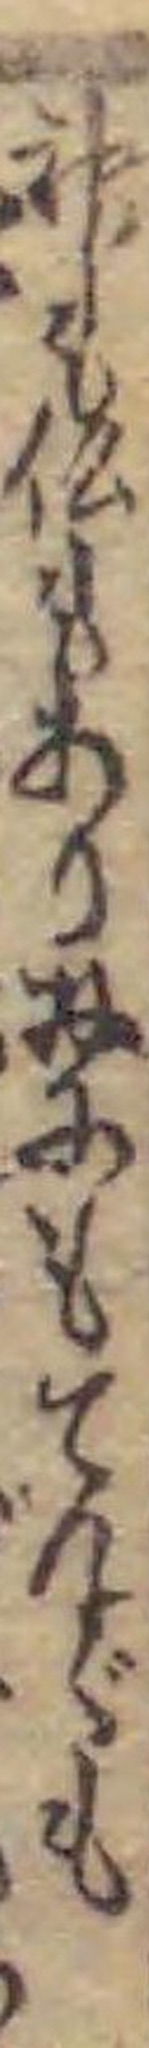神も仏もありおにもてんぐも
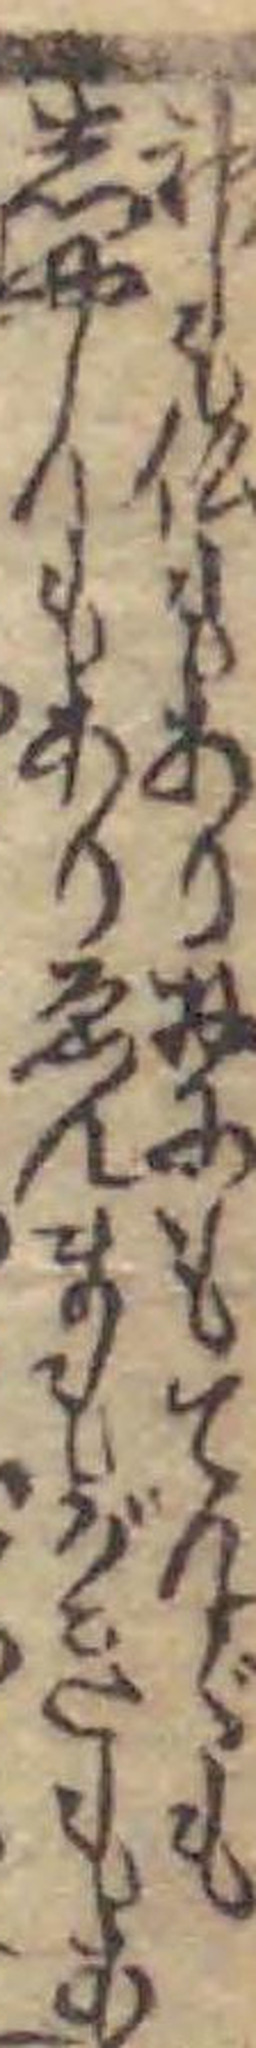しやしんもありゑんまもがきもあり
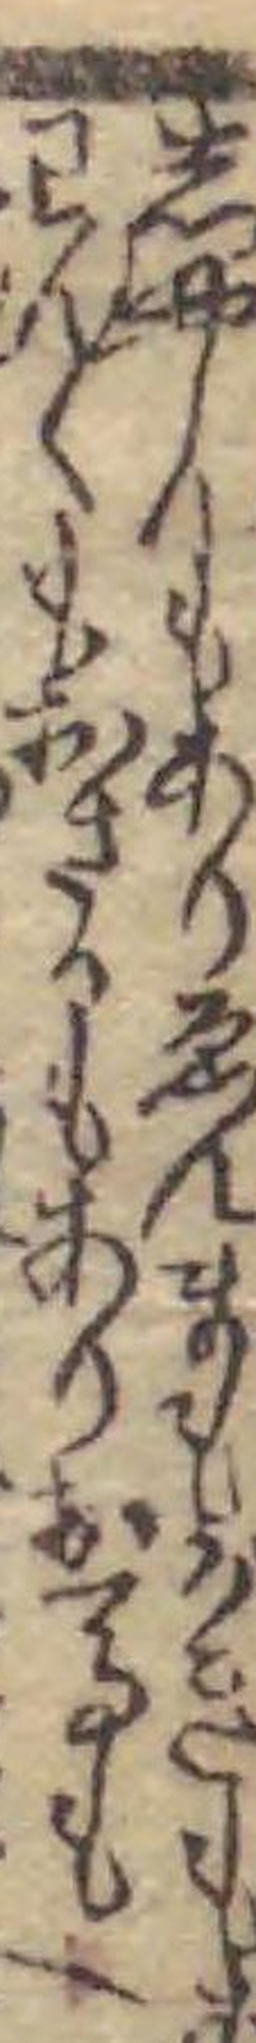わん〳〵もおさるもありお馬も
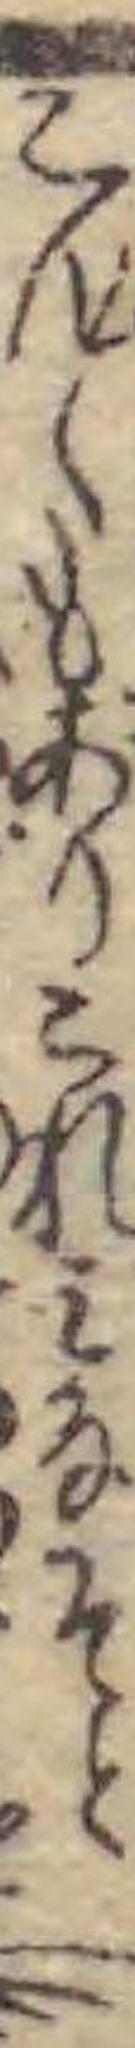こん〳〵もありこれみなそと
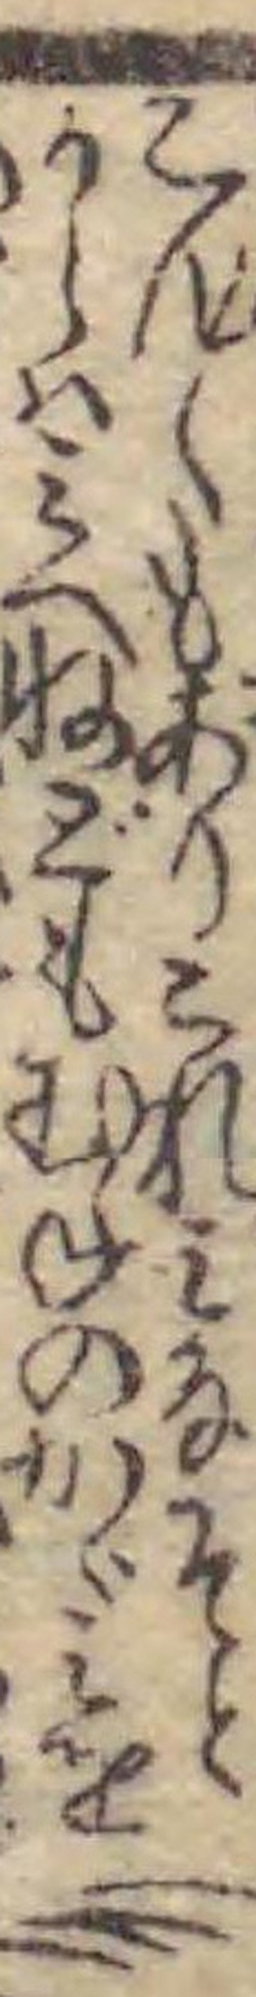からはみへねどもむねのかゞみを
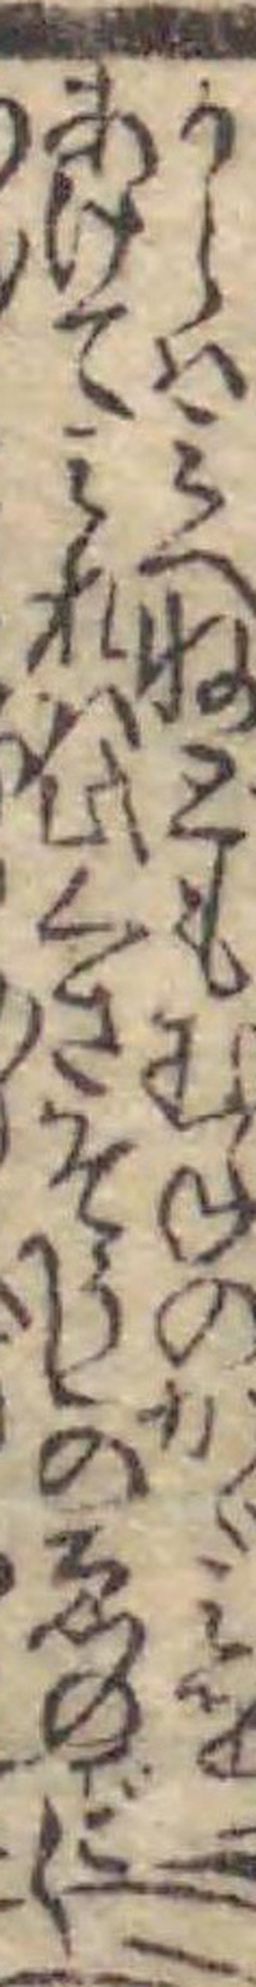あけてみれは此くさそうしのゑのごとく
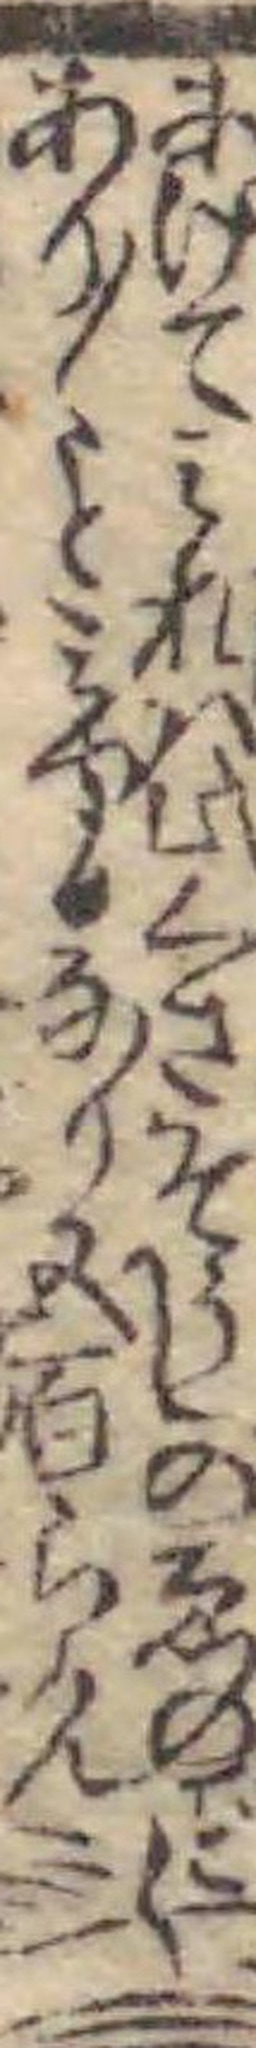あり〳〵とみゆるなり五百らかん
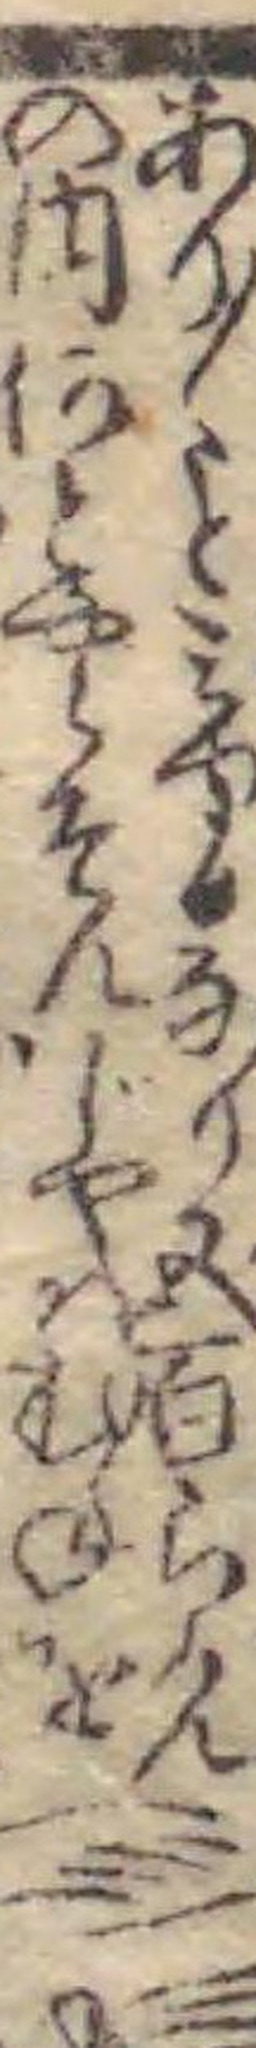の内何とやらそんじやはむねを
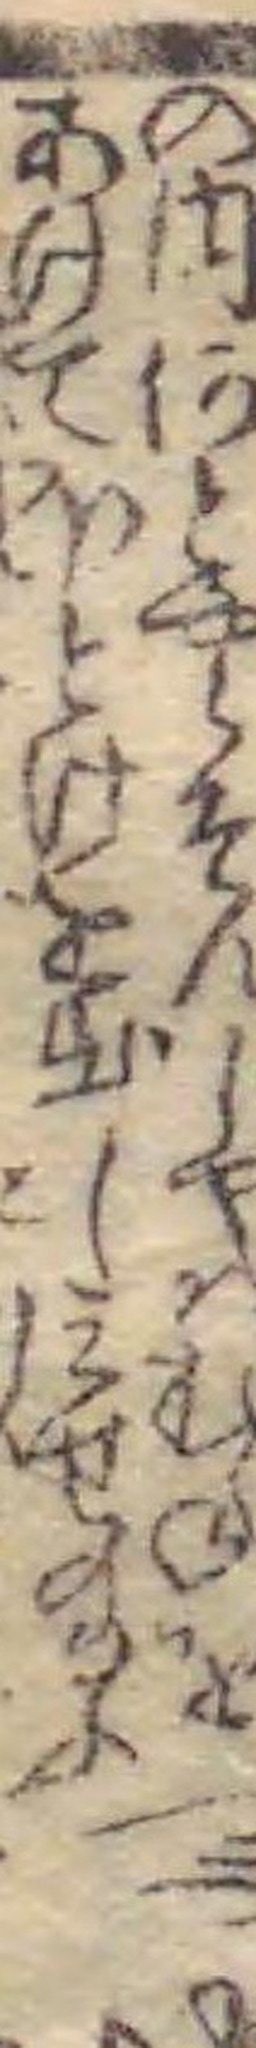あけてほとけを出しみせ給ふ
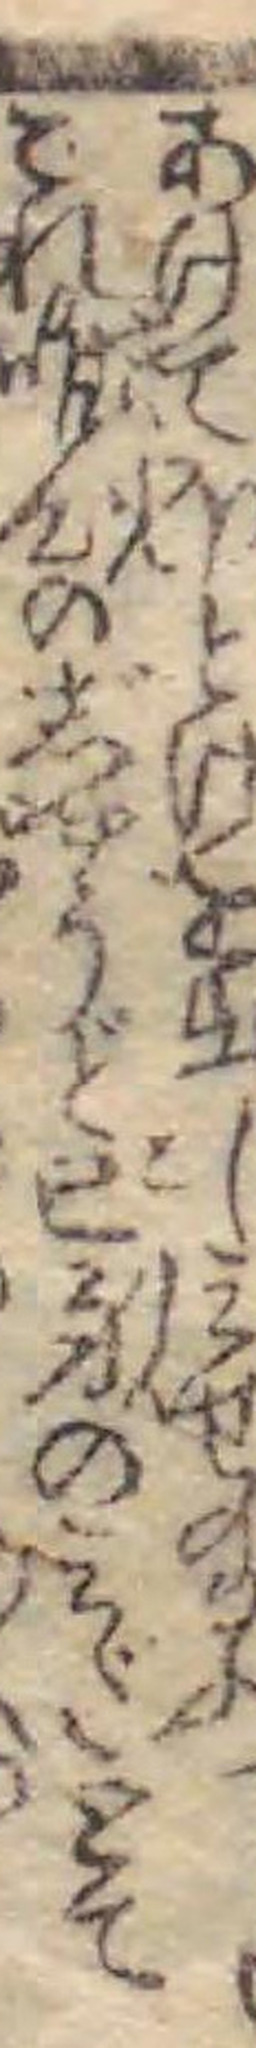これ唯心のじやうど己身のみだとて
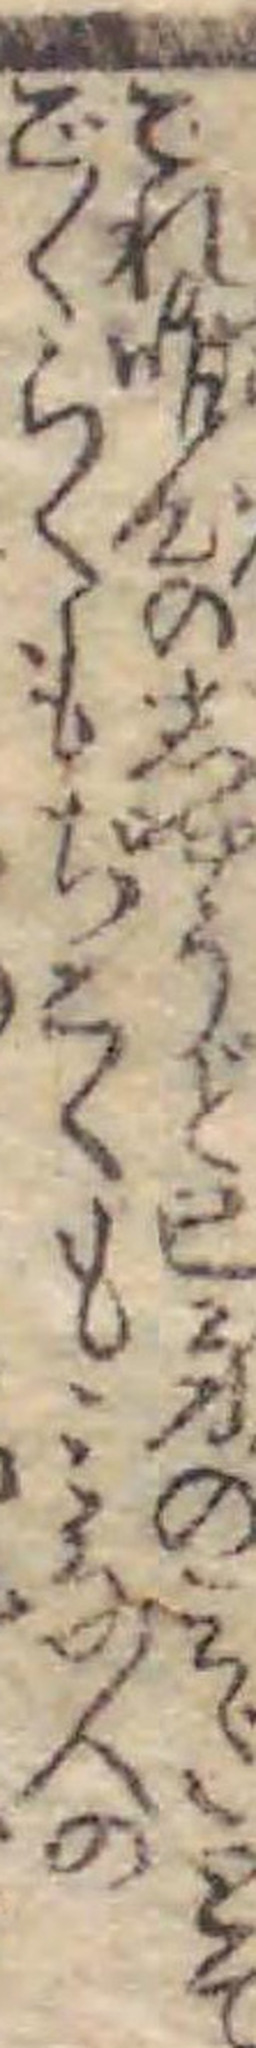ごくらくもぢこくもみな人の
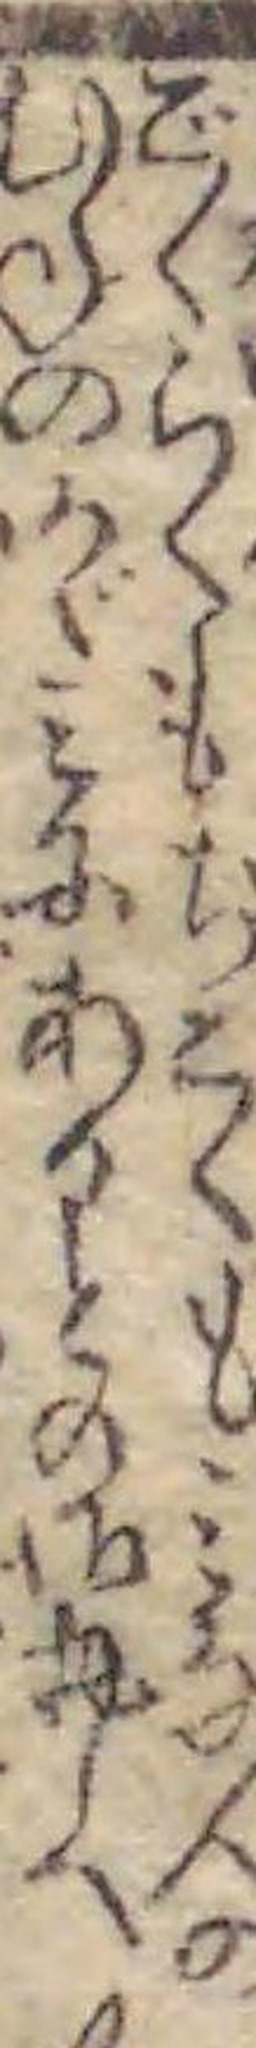むねのかゞみにあるとの御おしへ
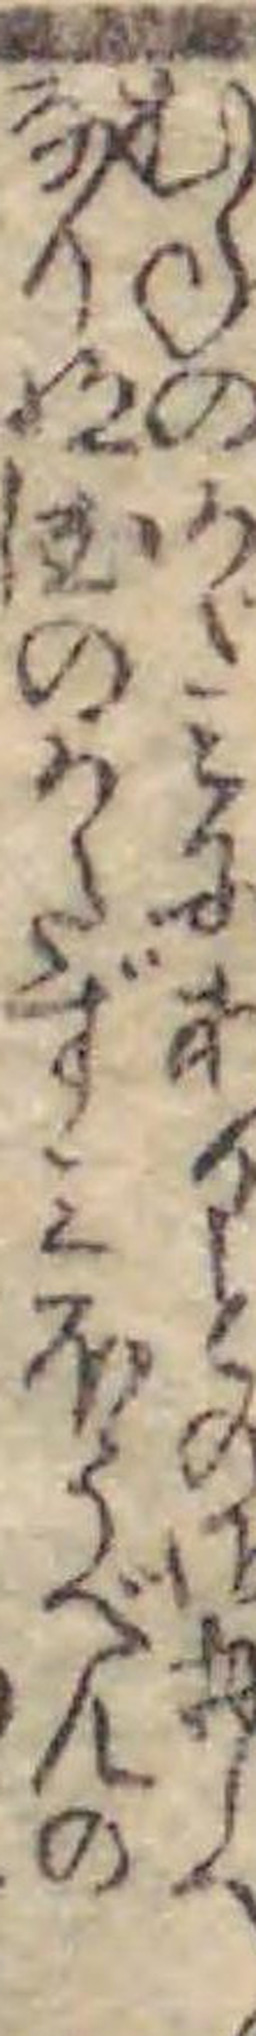なり明のかたずみほうべんの
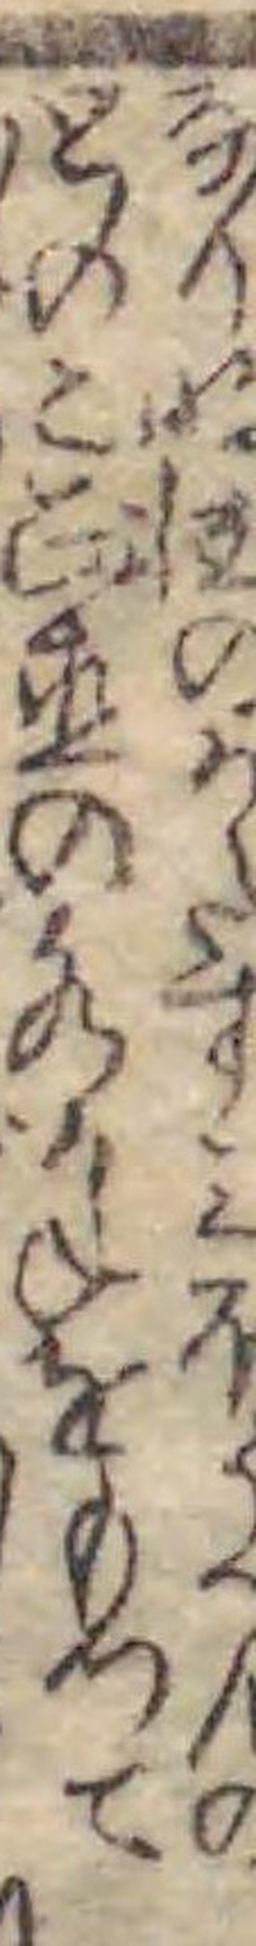とのこ正直の水かねをもつて
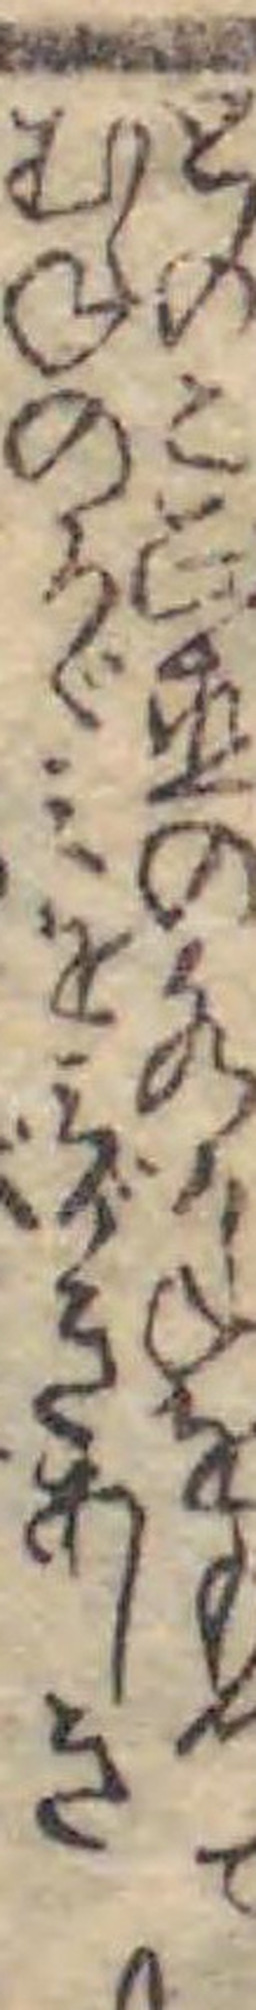むねのかゞみうぃみがきあしき
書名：人心鏡写絵 : 3巻
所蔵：国立国会図書館 National Diet Library, JAPAN
